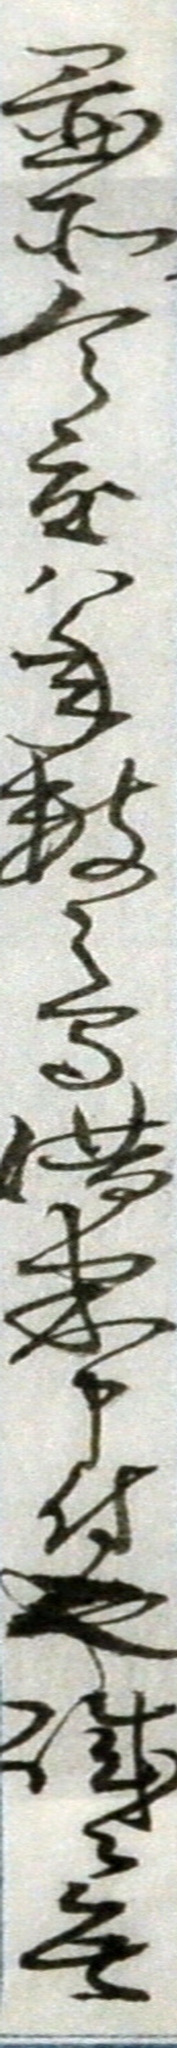置所今度ハ年数之間借米申付也誠々無
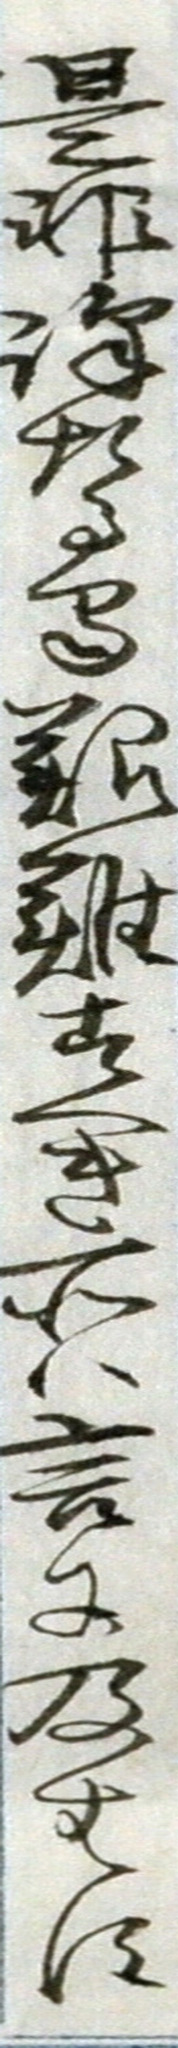是非たる間艱難すへき所ハ言に及はす
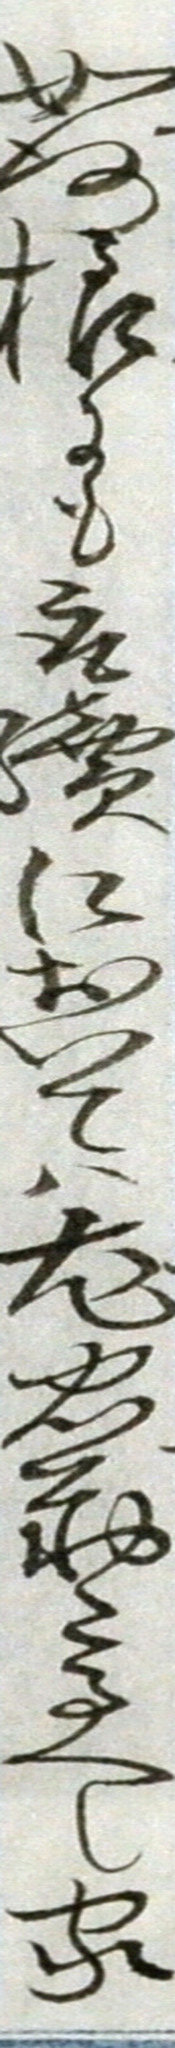如何様にも取続においてハ尤忠勤たるへし家
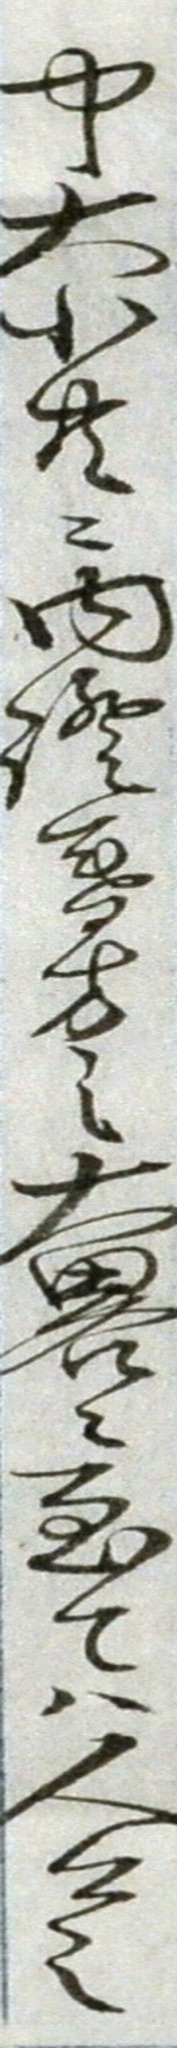中大小共ニ内證暮方之大略ニ至てハ人々之
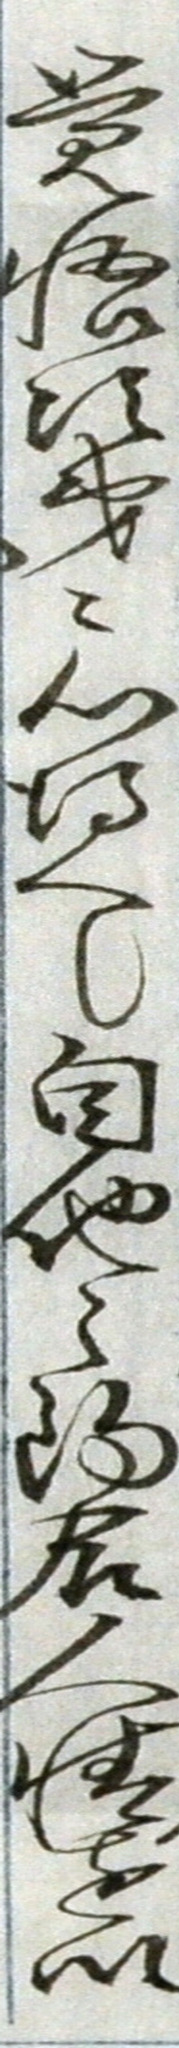覚悟次第ニ心得へし自他之場合人情を以
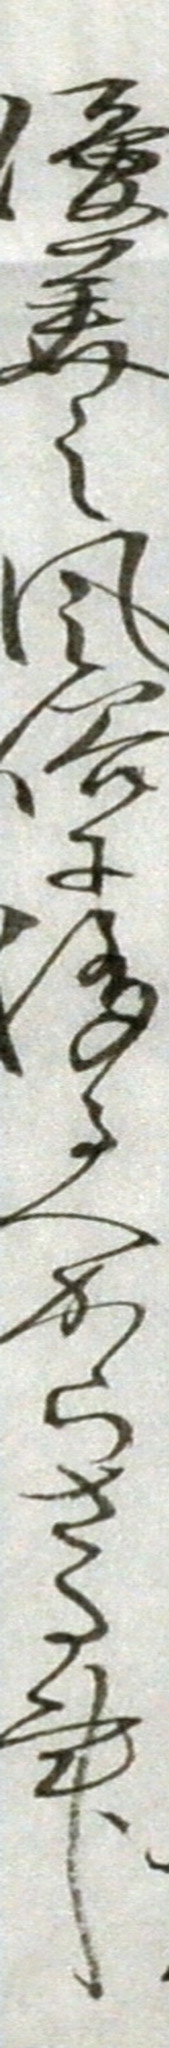優美之風俗に移るへからさる事
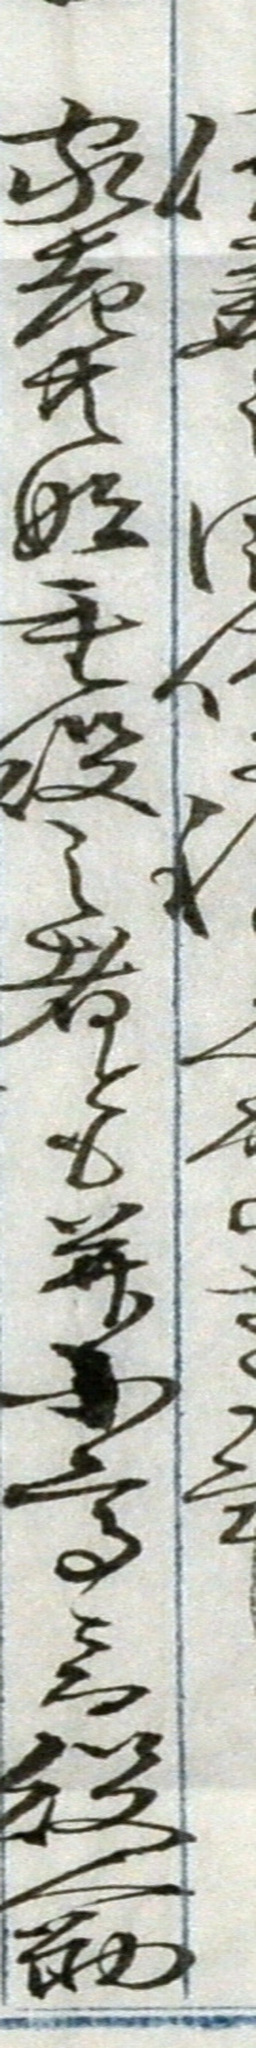一家老共始無役之者とも并小高ニ而役人勤
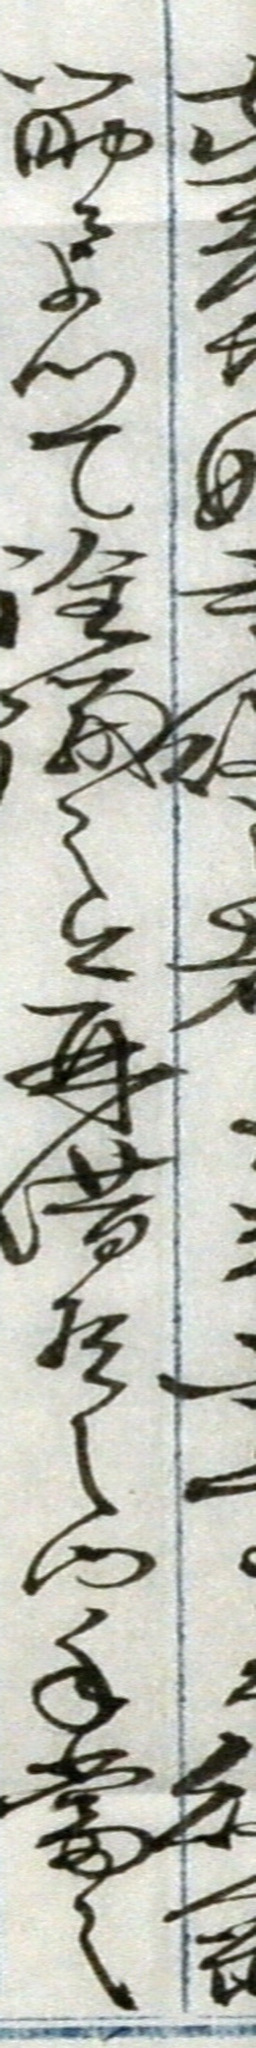筋ニよつて詮議之上再借有之内手当之
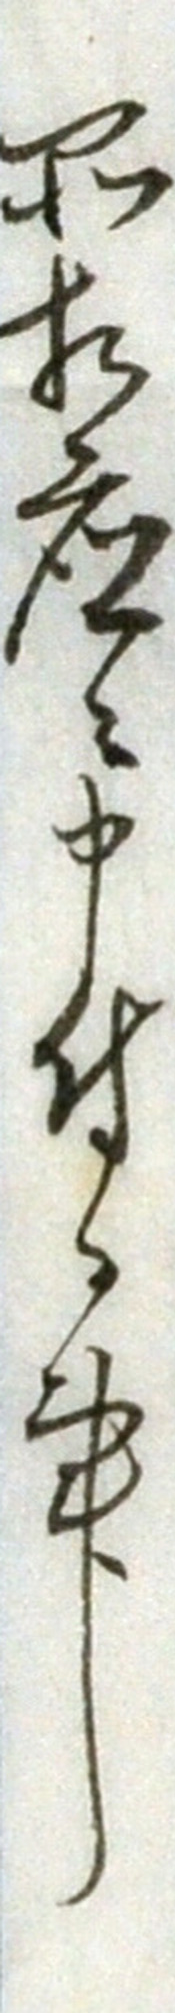品相応ニ申付る事
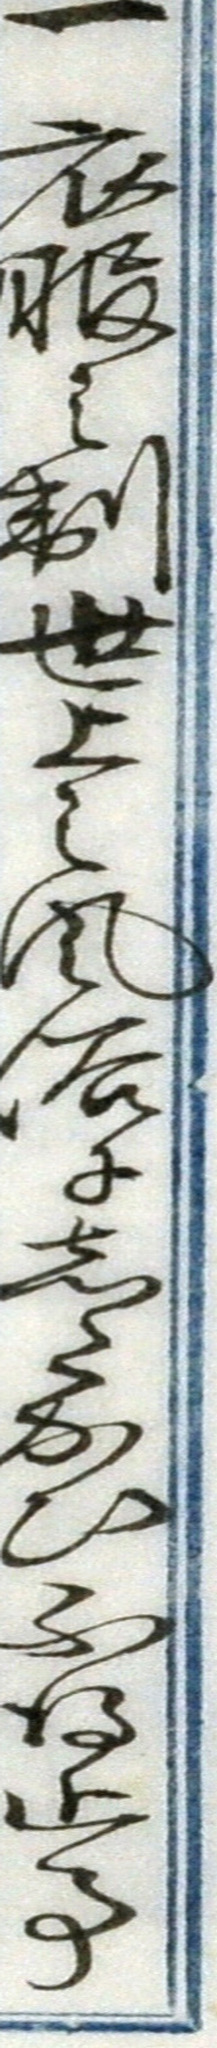一衣服之制世上之風俗にしたかひ不得止事
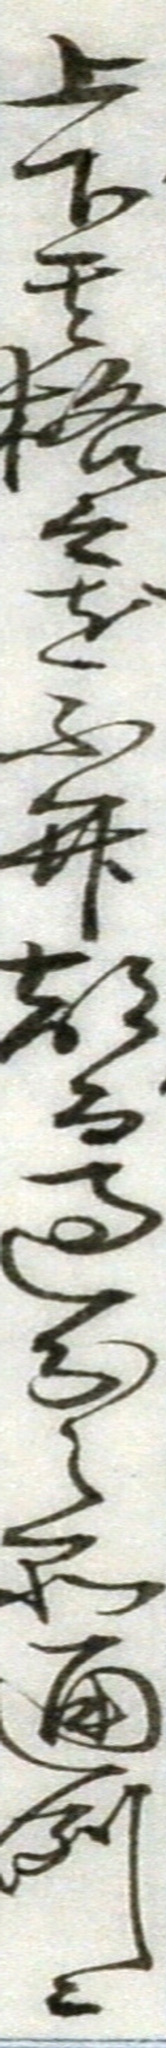上下其格々を不弁都而過分之品通例ニ
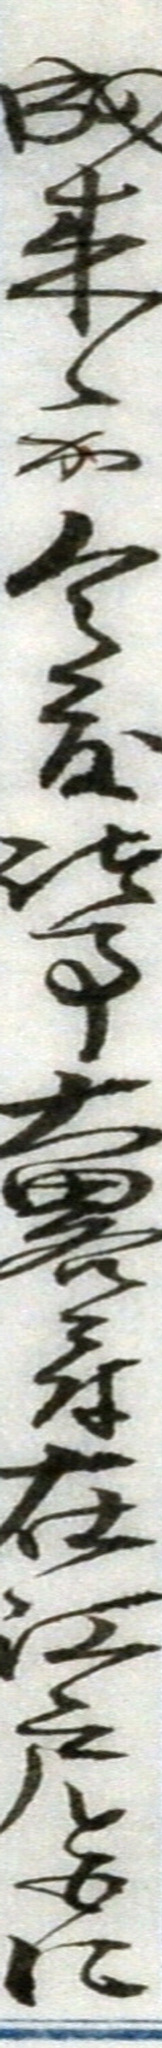成来候か今度諸事大略ニ付在江戸ともに
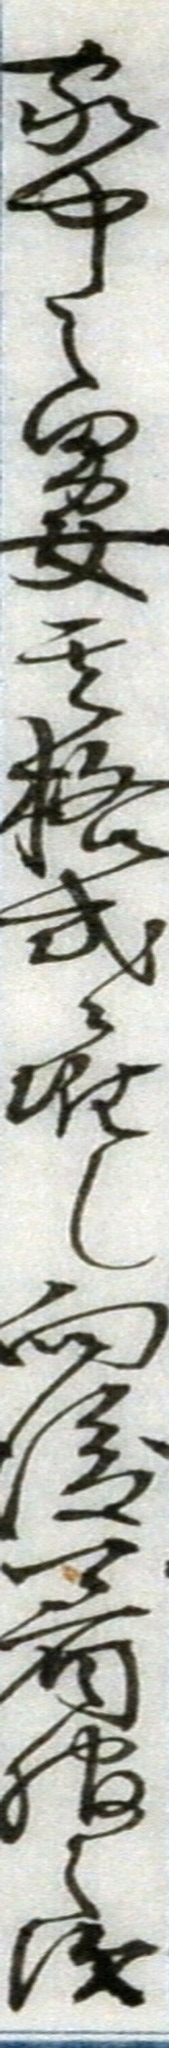家中之男女其格式ニ准し向後着服之次
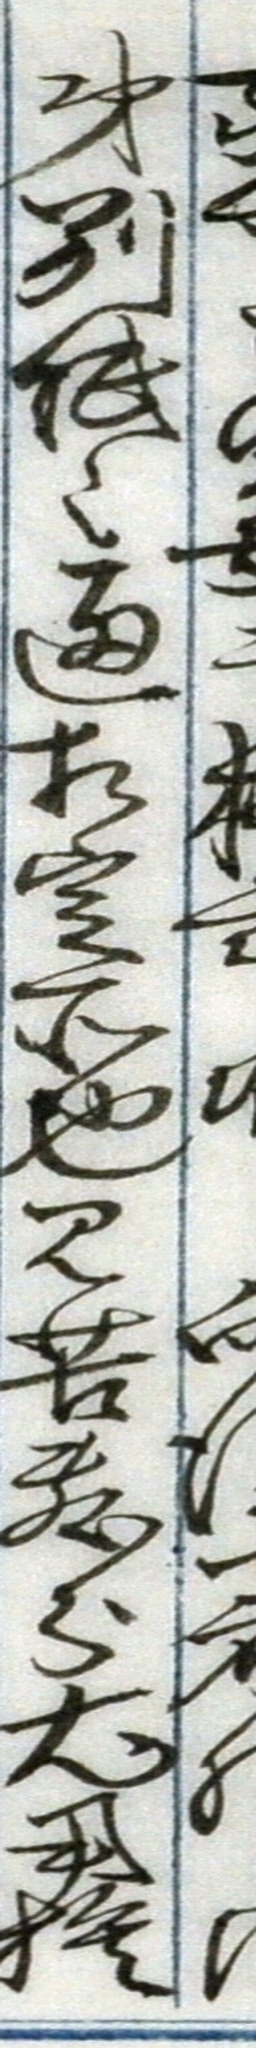第別紙之通相定所也見苦敷分尤用捨
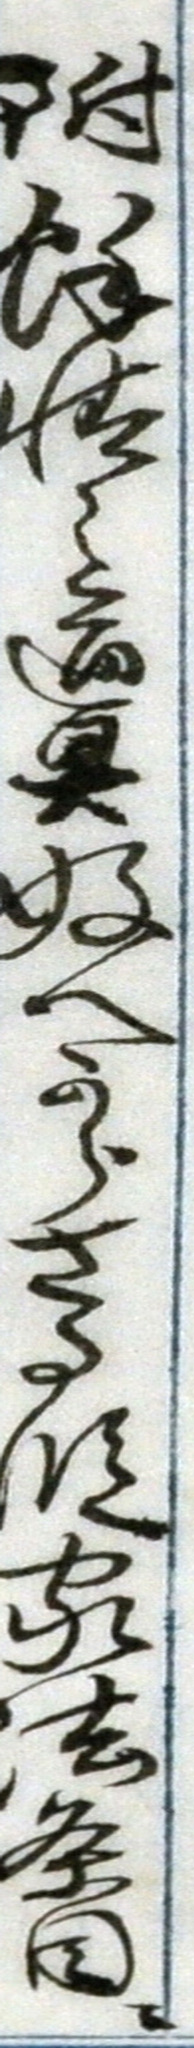附余情之道具好へからさる段家法条目ニ
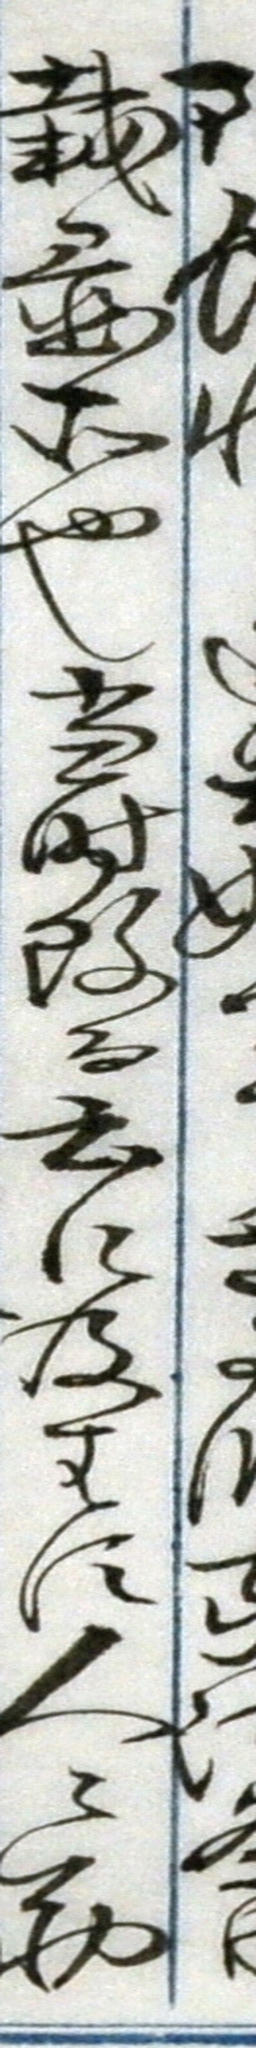載置所也当時改而云に及はす人々勤
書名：頼由公御定書
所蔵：伊那市立高遠町図書館・合同会社AMANE
